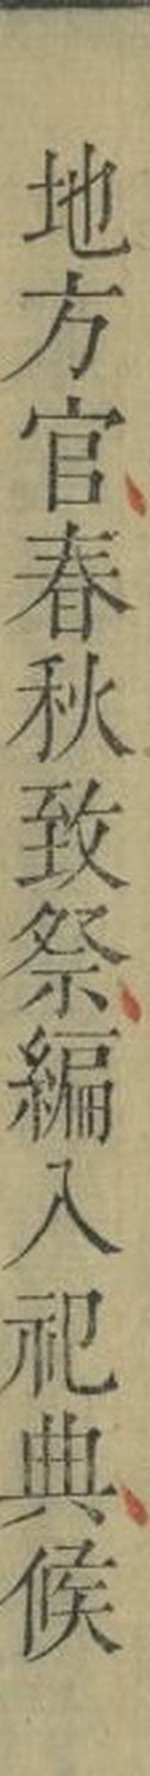地方官春秋致祭編入祀典候
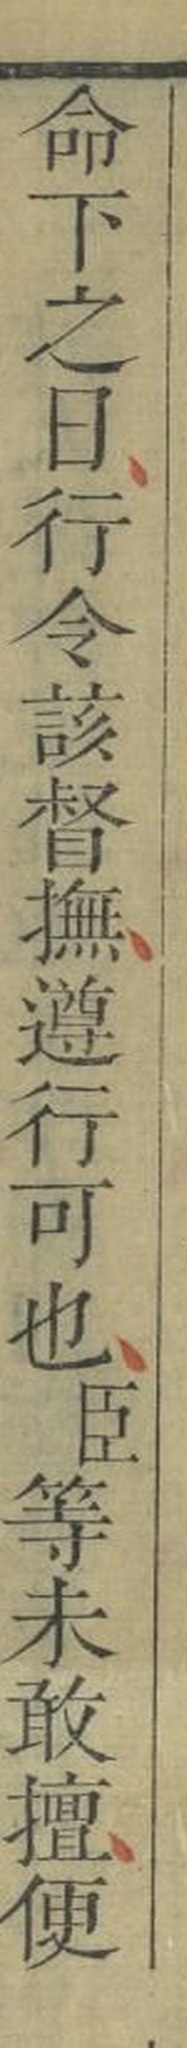命下之日行令該督撫遵行可也臣等未敢擅便
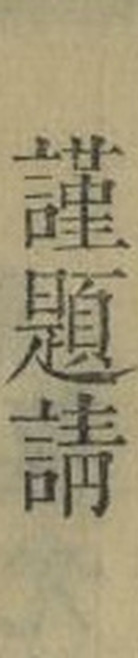謹題請
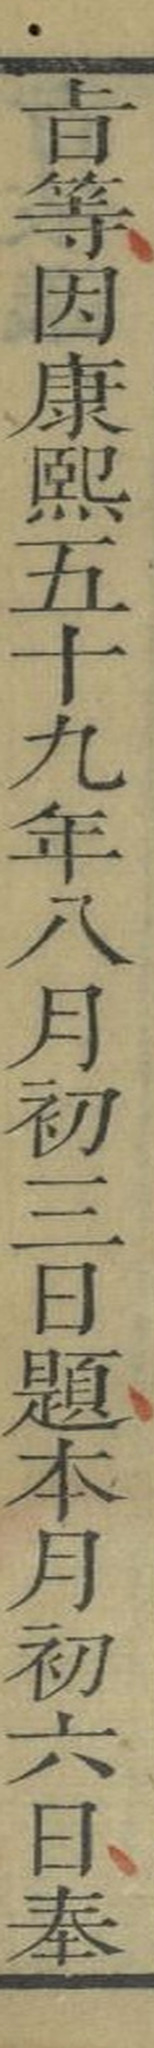㫖等因康熙五十九年八月初三日題本月初六日奉

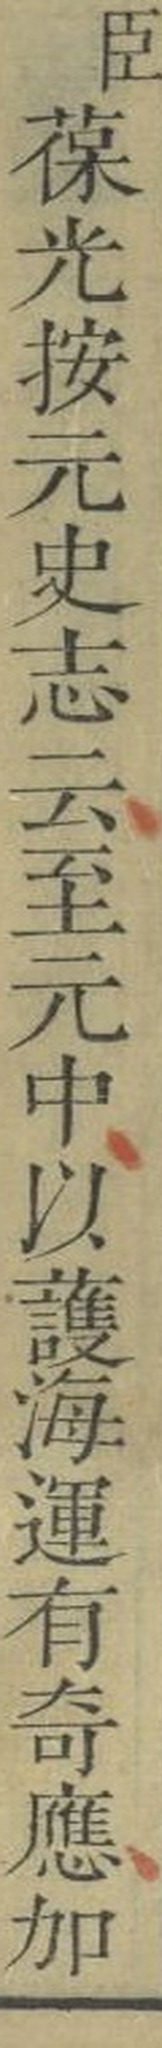臣葆光按元史志云至元中以䕶海運有奇應加
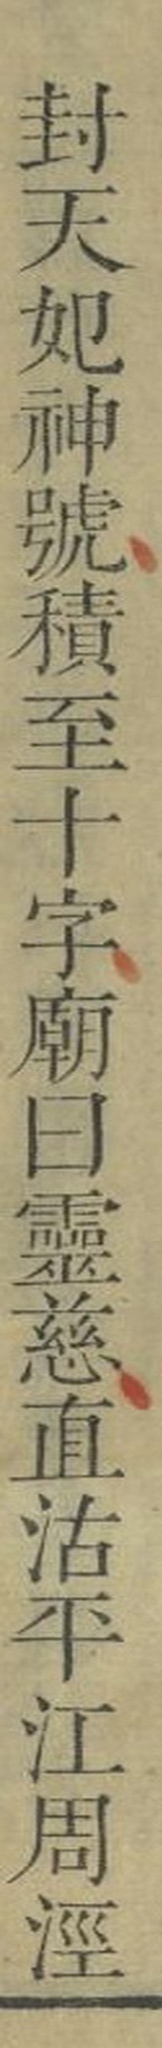封天妃神號積至十字廟曰靈慈直沽平江周涇
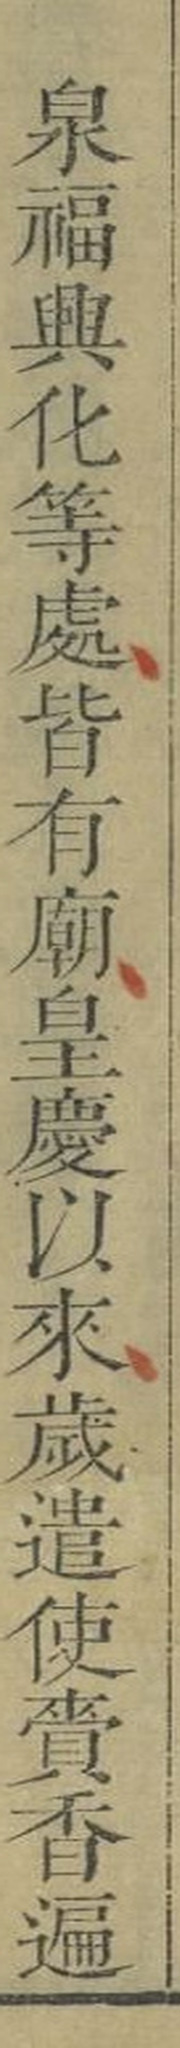泉福興化等處皆有廟皇慶以來歲遣使賫香遍
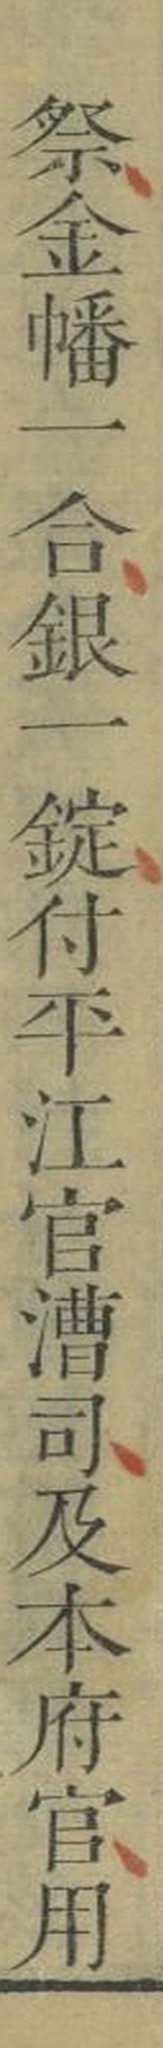祭金幡一合銀一錠付平江官漕司及本府官用
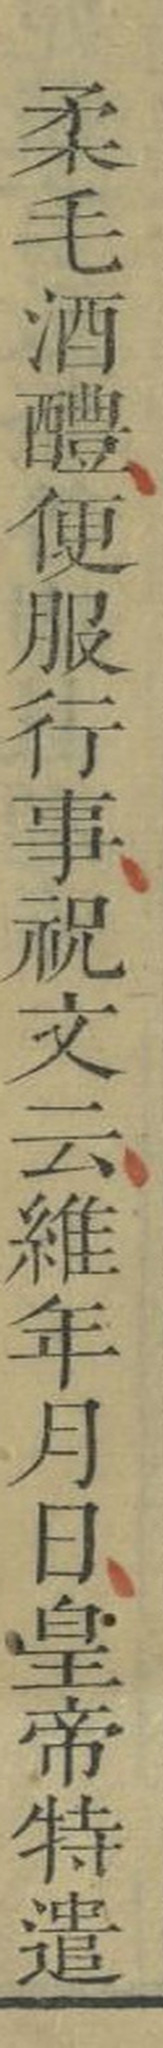柔毛酒醴便服行事祝文云維年月日皇帝特遣
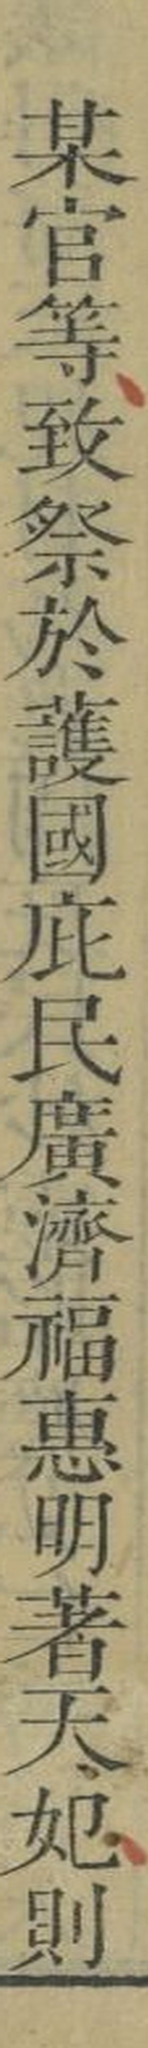某官等致祭於䕶國庇民廣濟福惠明著天妃則
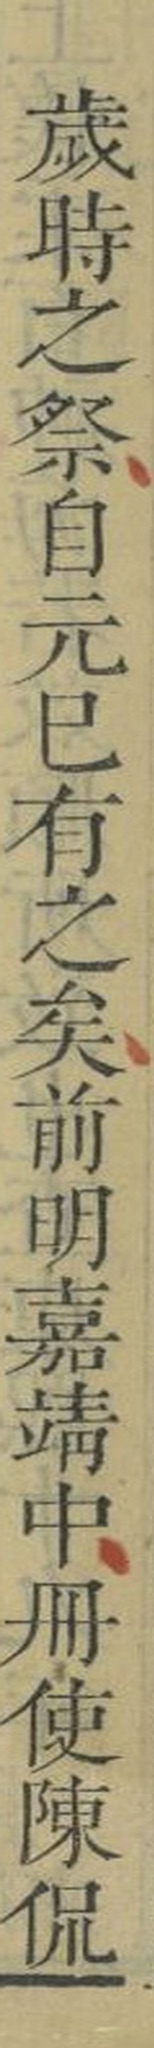歲時之祭自元巳有之矣前明嘉靖中冊使陳侃
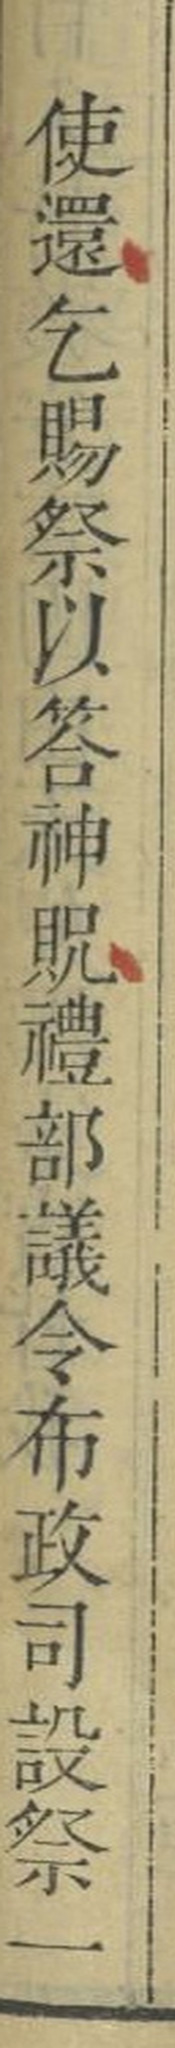使還乞賜祭以答神貺禮部議令布政司設祭一
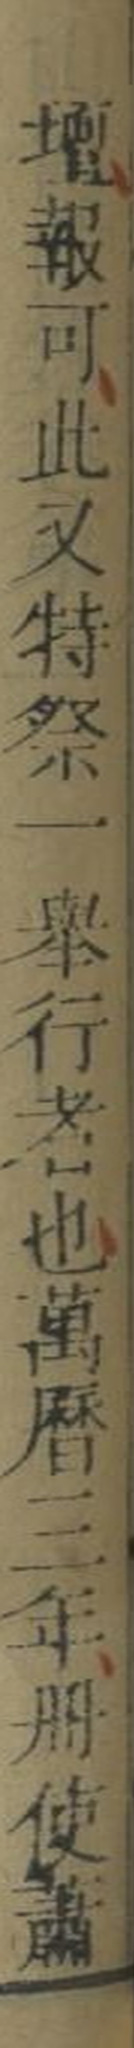壇報可此又特祭一舉行者也萬曆三年冊使蕭
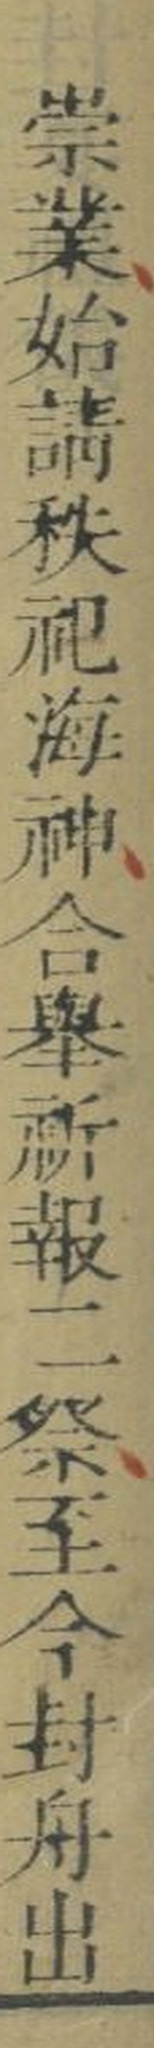崇業始請秩祀海神合舉祈報二祭至今封舟出
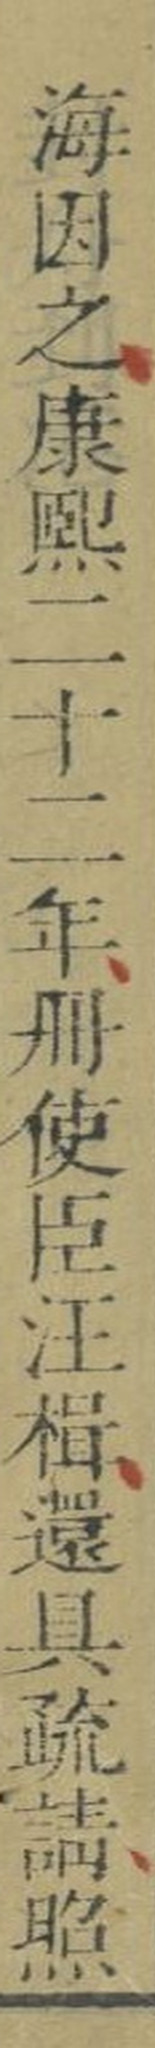海因之康熙二十二年冊使臣汪楫還具疏請照
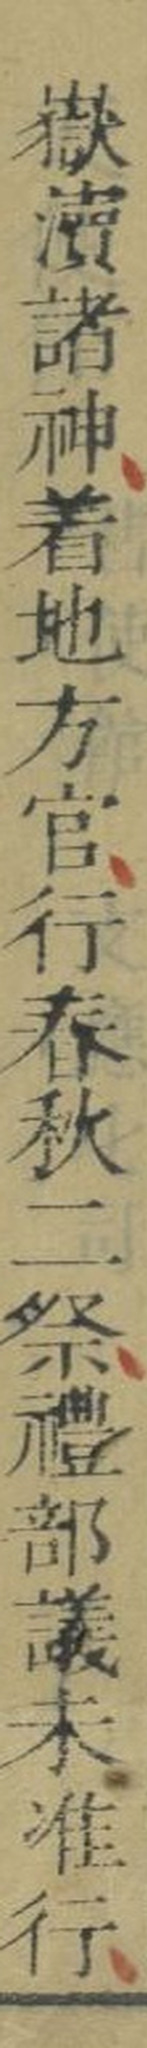嶽瀆諸神着地方官行春秋二祭禮部議未准行
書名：中山伝信録 巻一、巻二
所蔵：University of the Ryukyus Library
